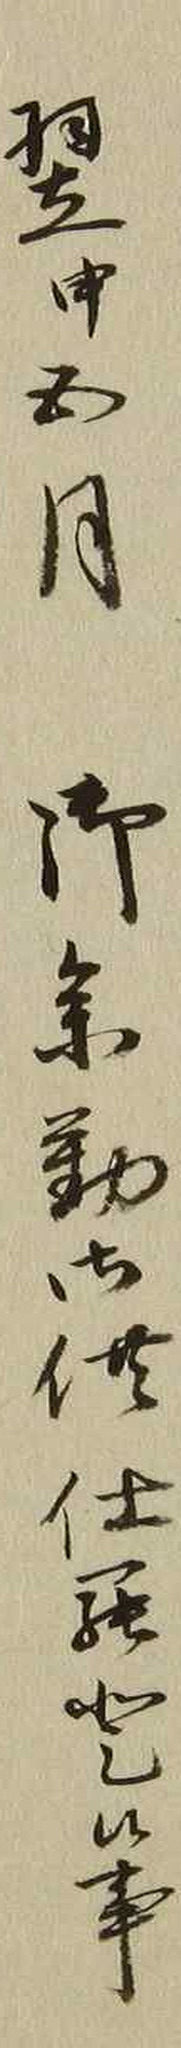翌申五月御参勤御供仕罷登候事
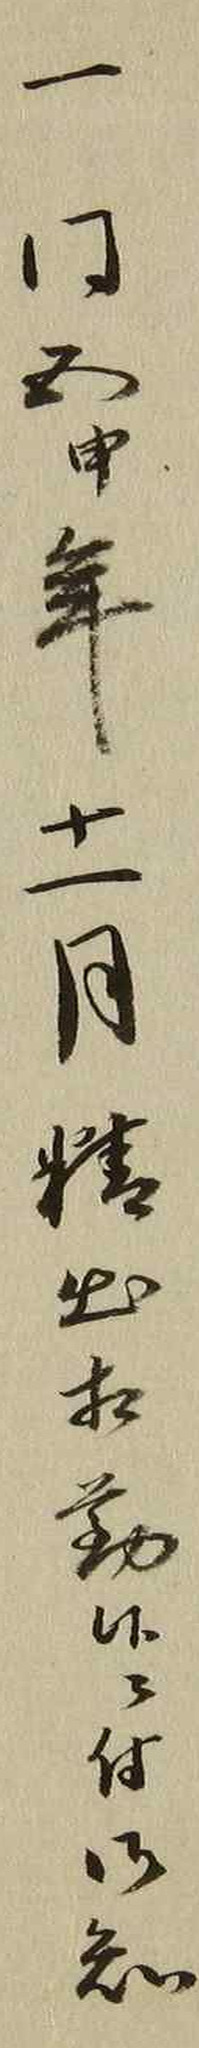一同五申十一月精出相勤候ニ付御知
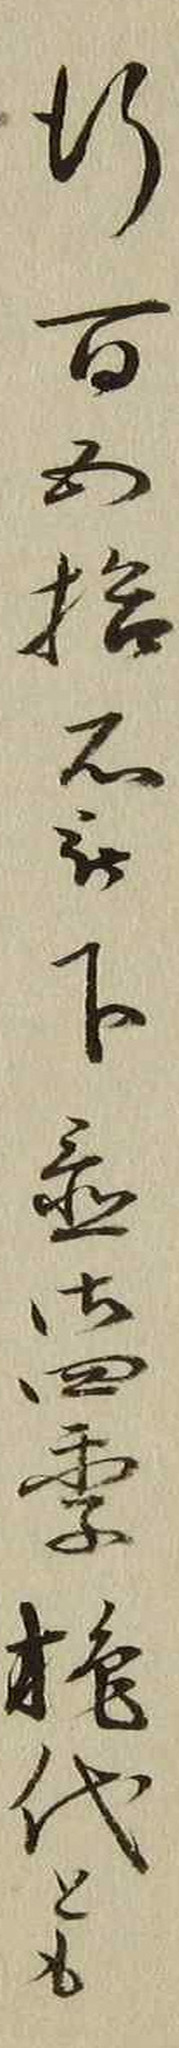行百五拾石被下置御四季施代とも
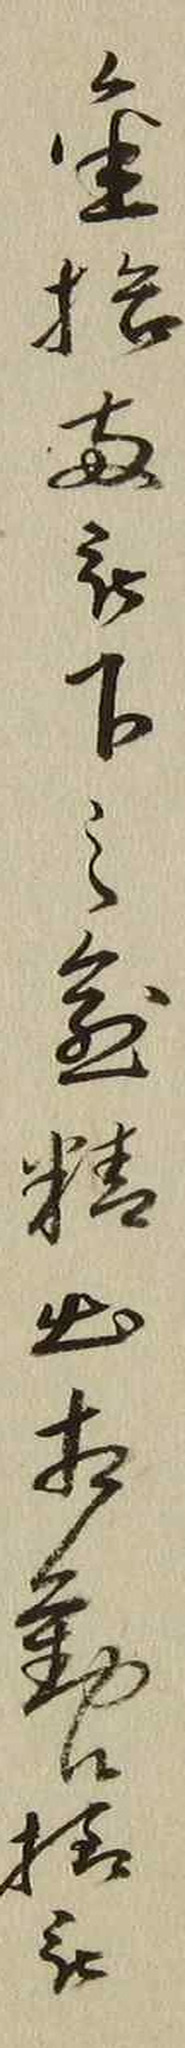金拾両被下之置精出相勤候様被
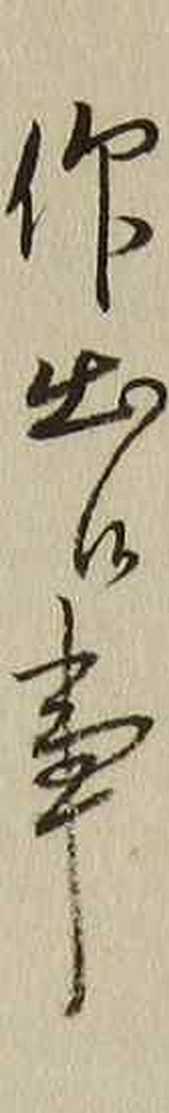仰出候事
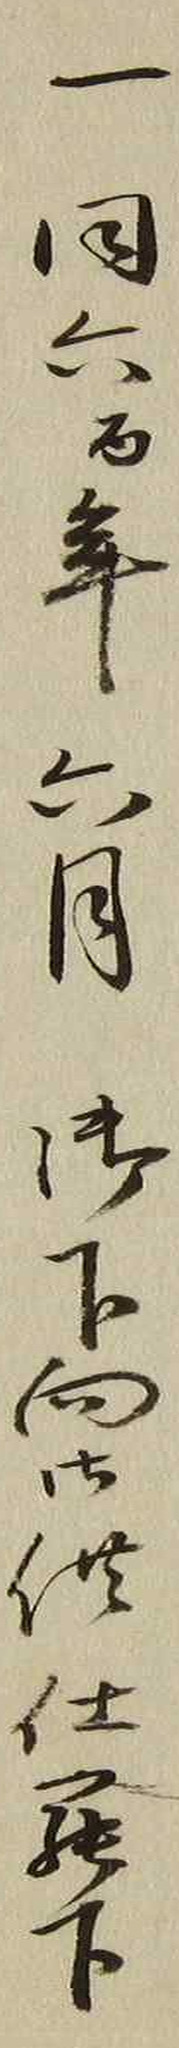一同六酉年六月御下向御供仕罷下
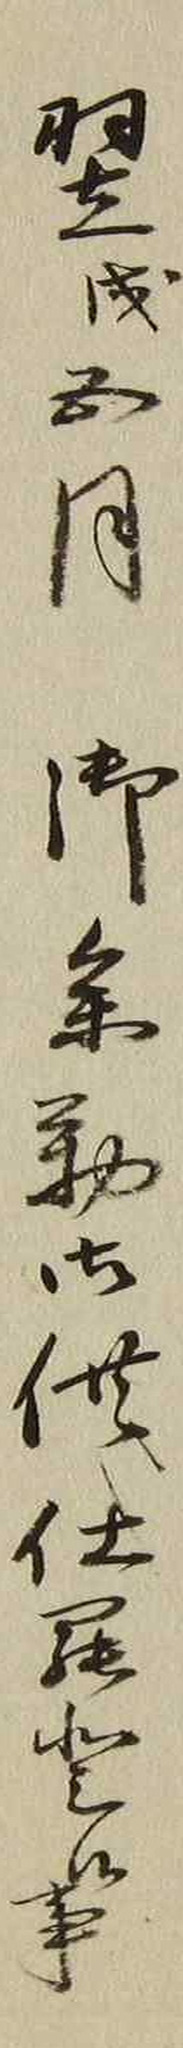翌戌五月御参勤御供仕罷登候事
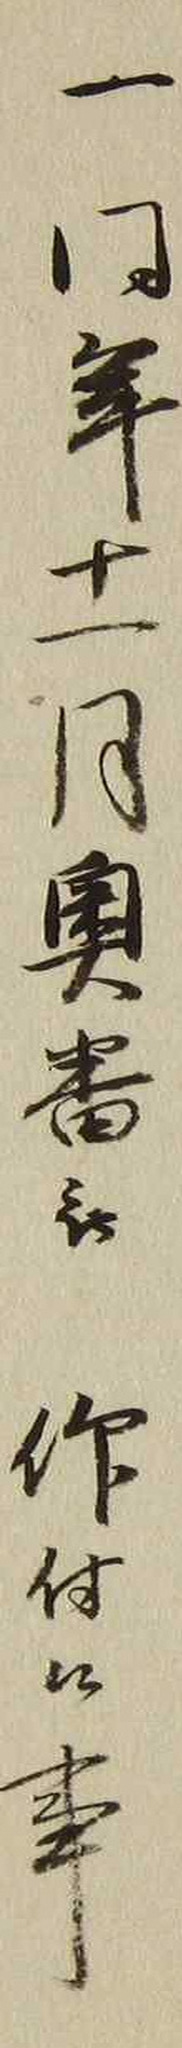一同年十一月奥番被仰付候事
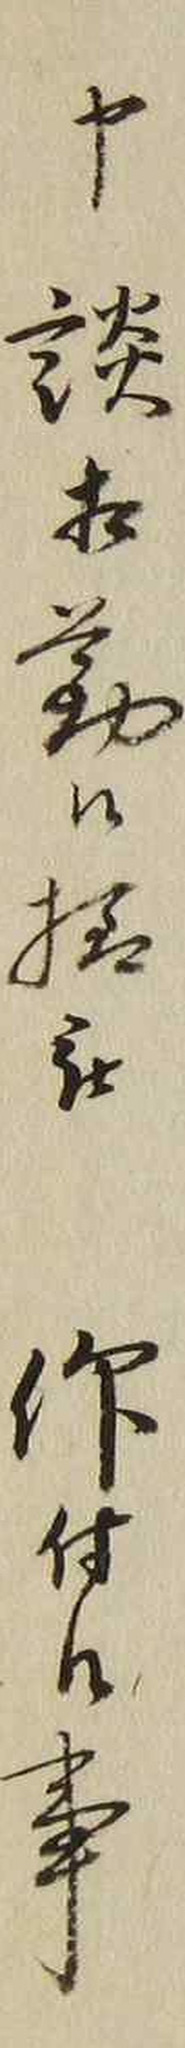申談相勤候様被仰付候事
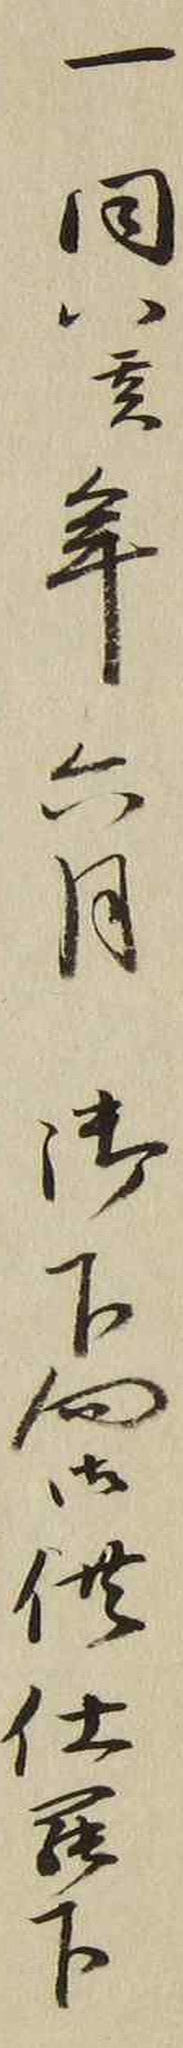一同八亥年六月御下向御供仕罷下
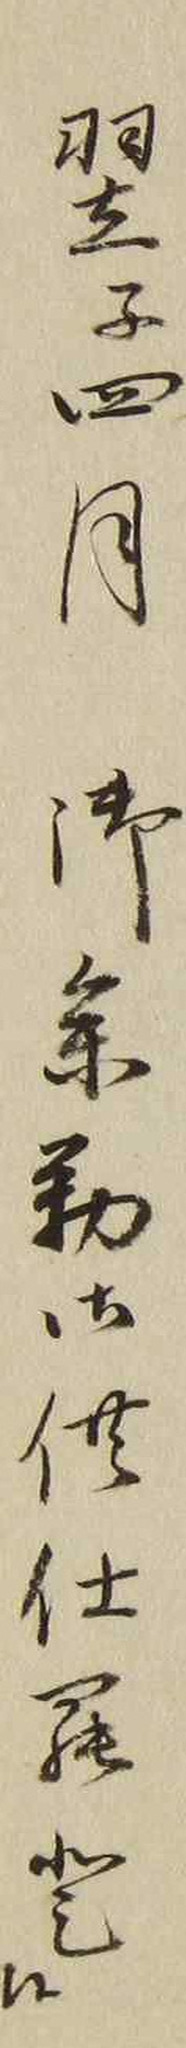翌子四月御参勤御供仕罷登候

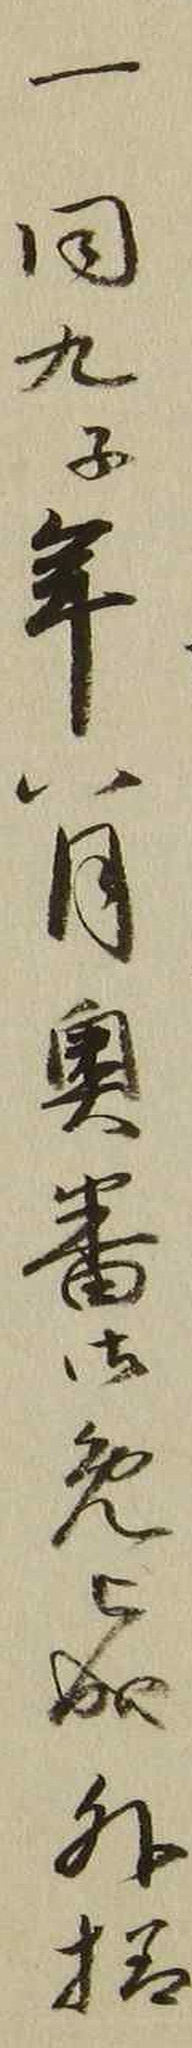一同九子年八月奥番御免被成外様
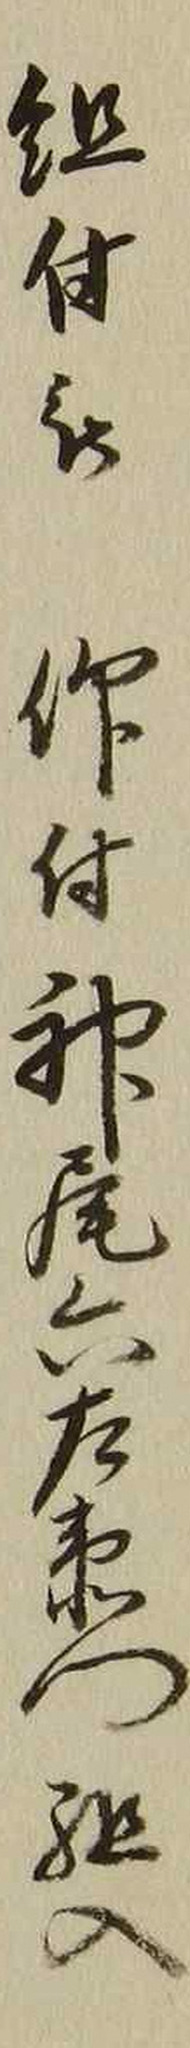組付被仰付神尾六左衛門組入
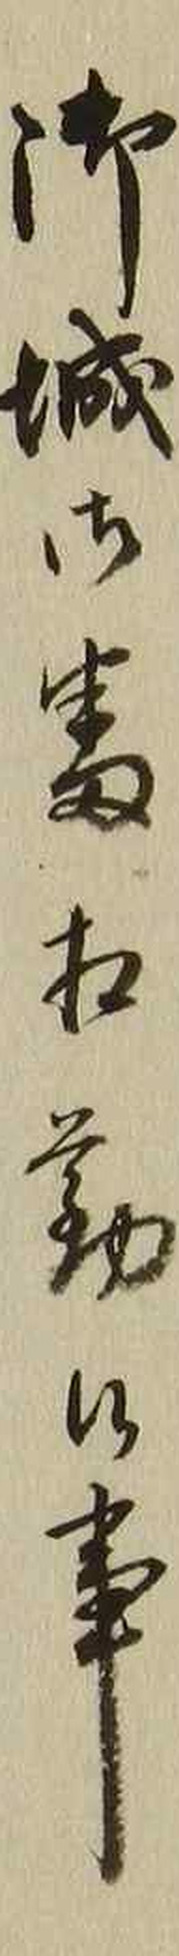御城御番相勤候事
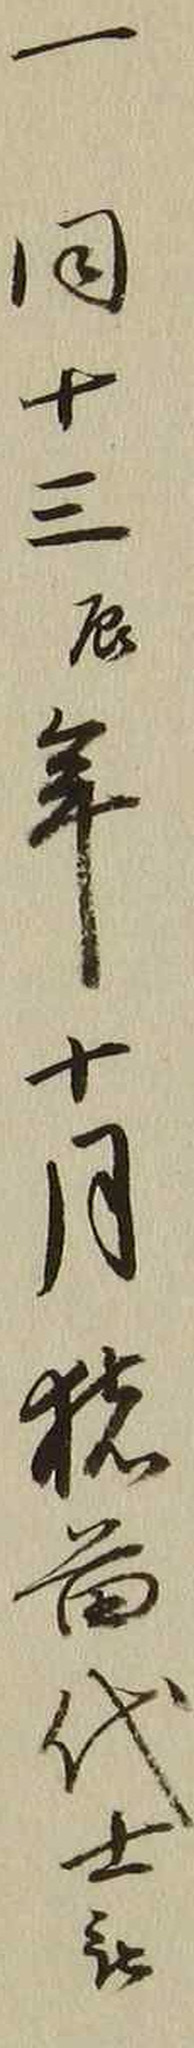一同十三辰年十月猪苗代被
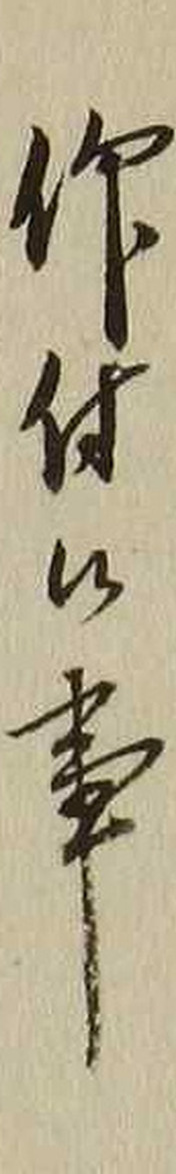仰付候事
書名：諸士系譜　巻之128　た之部4
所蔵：会津若松市立会津図書館
